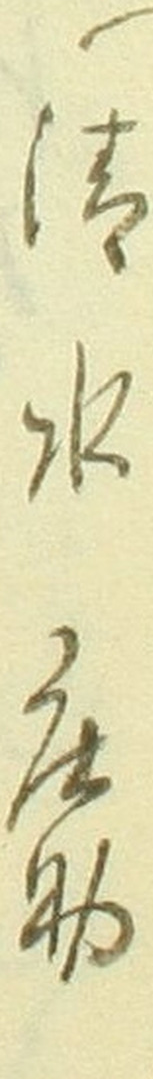清水庄助
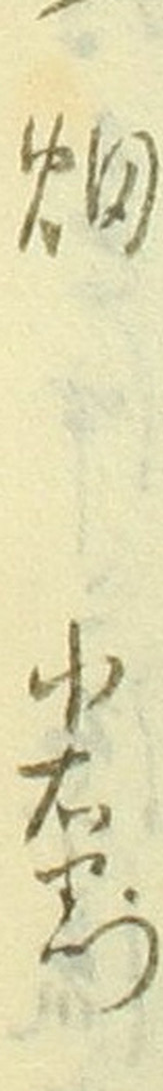畑小右衛門
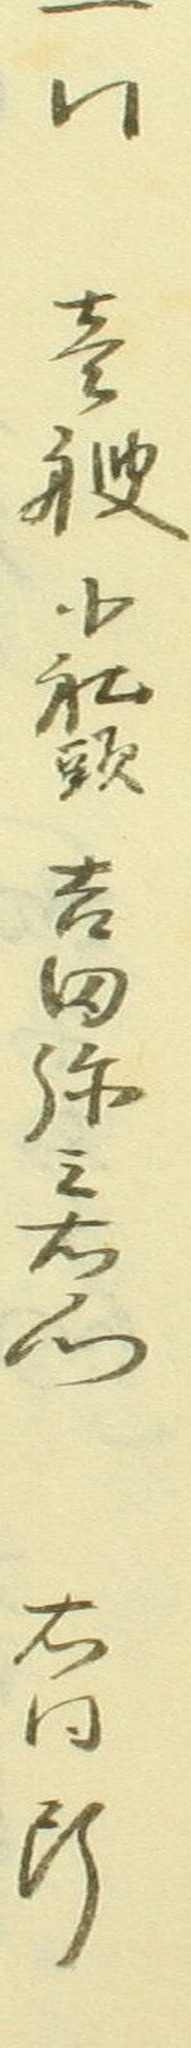一同壱艘小船頭吉田弥三右衛門右同断
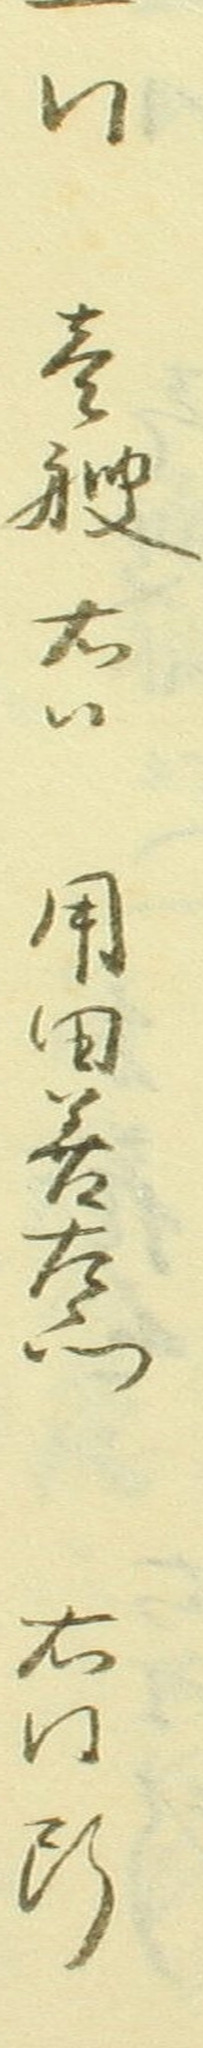一同壱艘右同用田善左衛門右同断
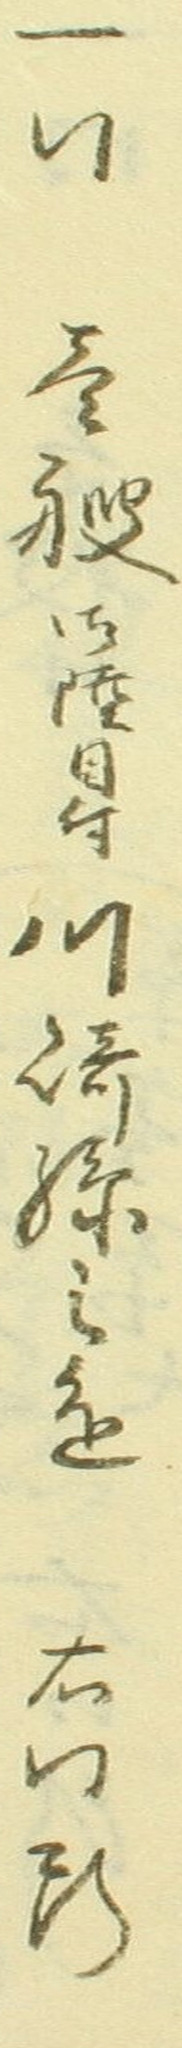一同壱艘御陸目付川崎孫之進右同断
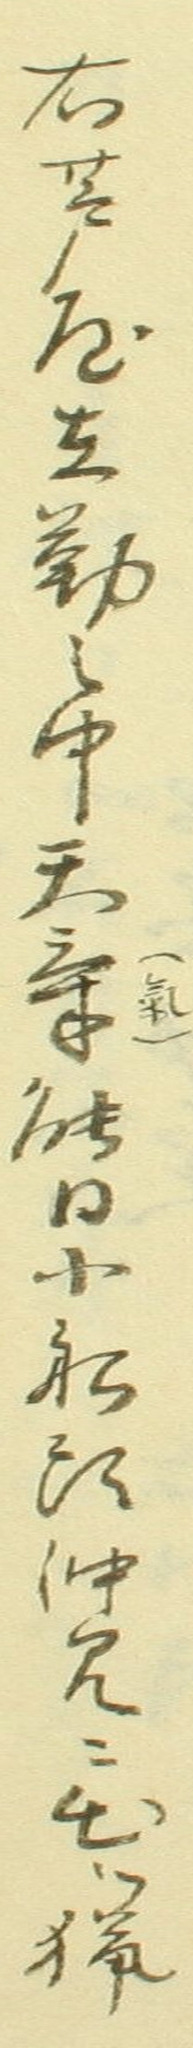右芦屋在勤之中天気能日小船頭沖見に出候猟
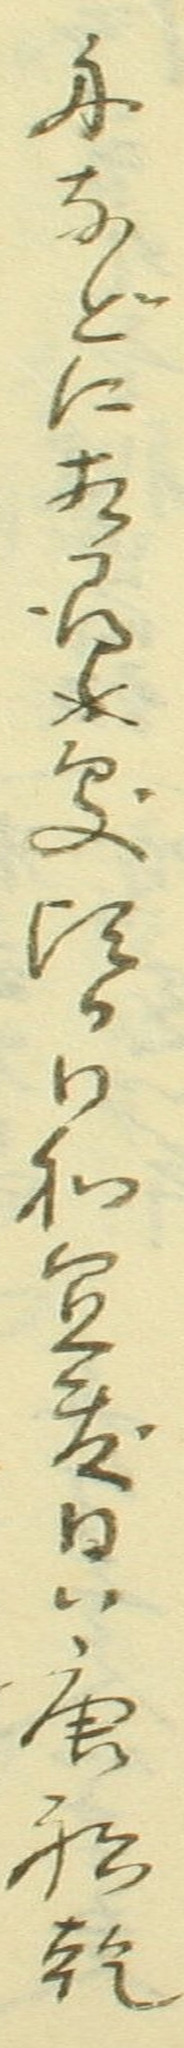舟などに相尋「」處頭か日和宜敷日は唐船乾
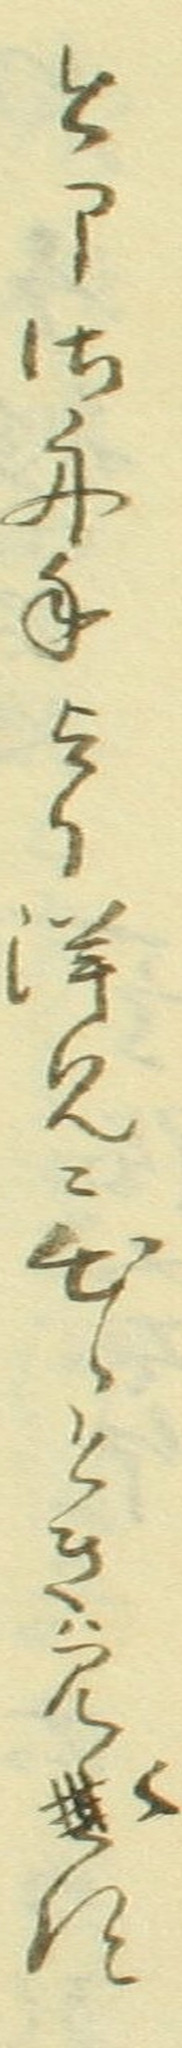と申御舟手より洋見に出候ときは見？？候
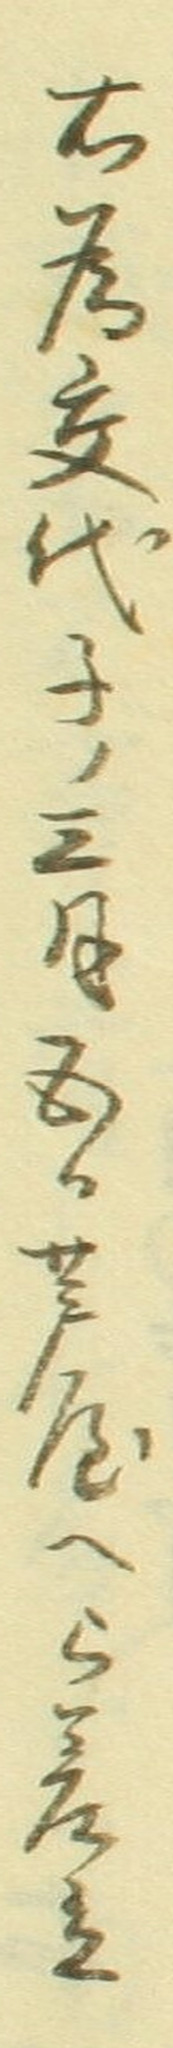右為交代子の三月五日芦屋へ被差立
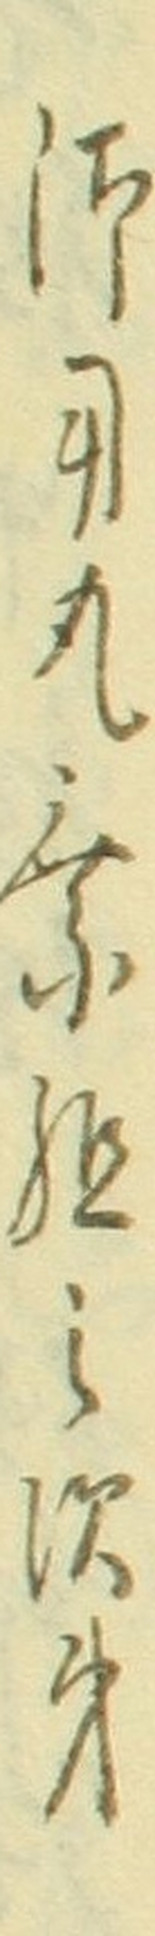御用丸乗組次第
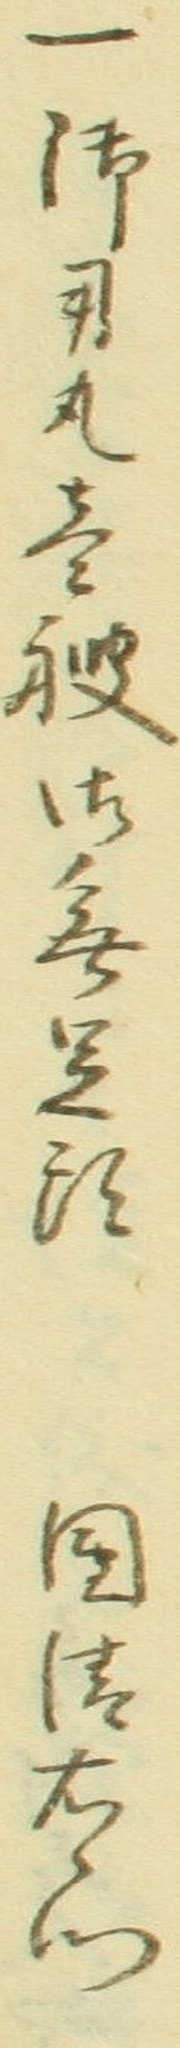一御用丸壱艘御無足頭団清右衛門
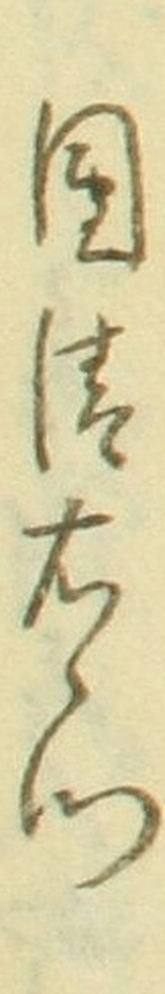畑小右衛門

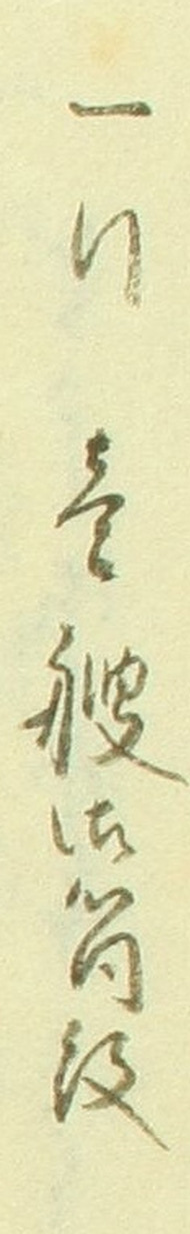一同壱艘御陸目付
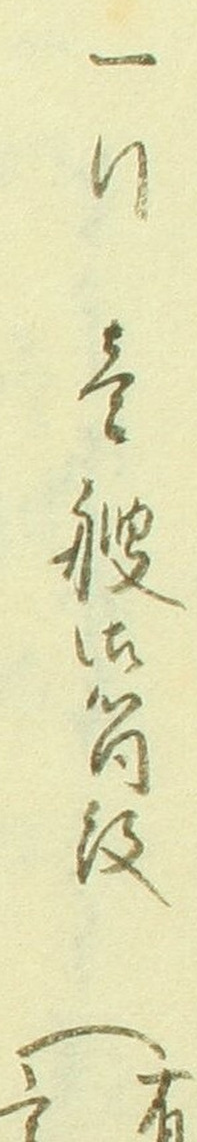一同壱艘御陸目付
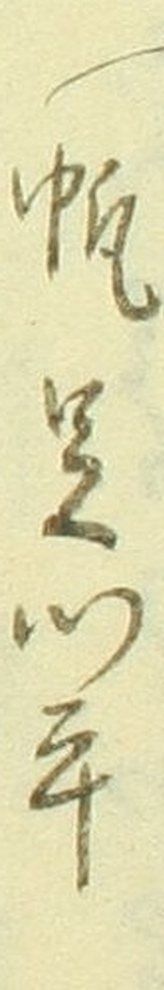帆足門平
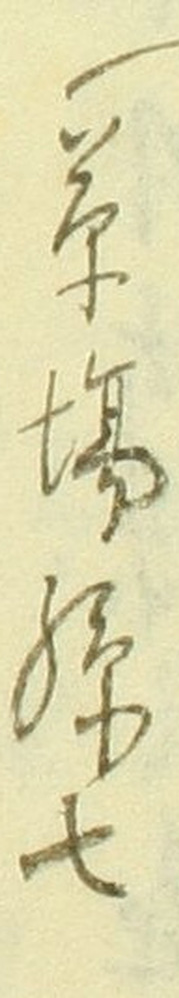草場孫七
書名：唐船漂流記 四
